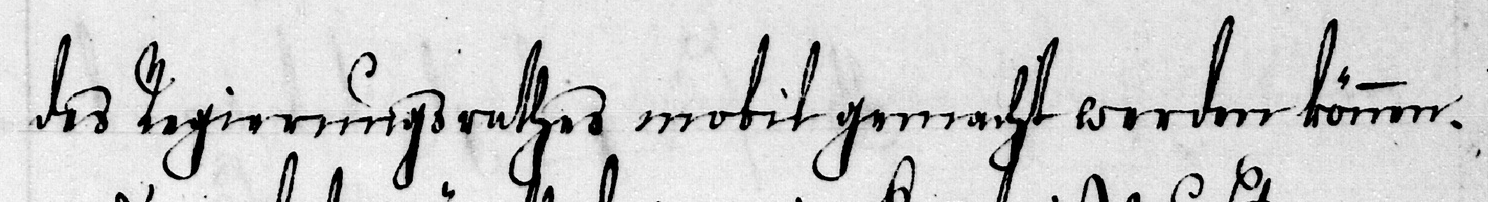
des Regierungsrathes mobil gemacht werden können.
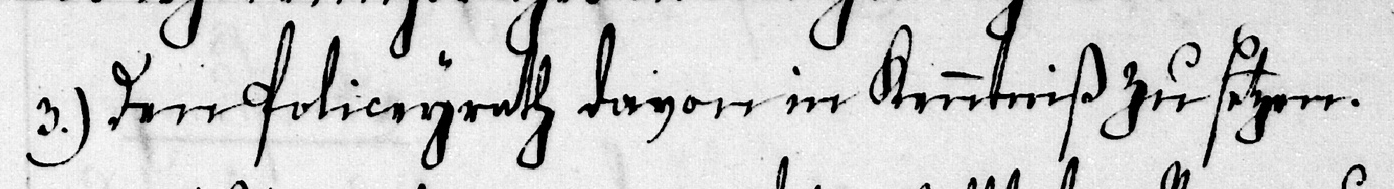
3.) Den Policeyrath davon in Kenntniß zu setzen.
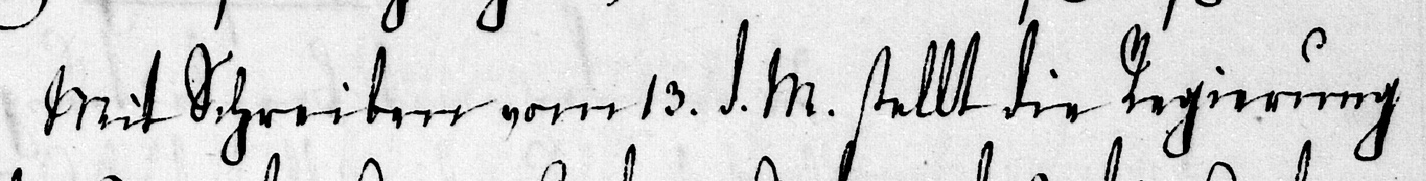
Mit Schreiben vom 13. d. M. stellt die Regierung
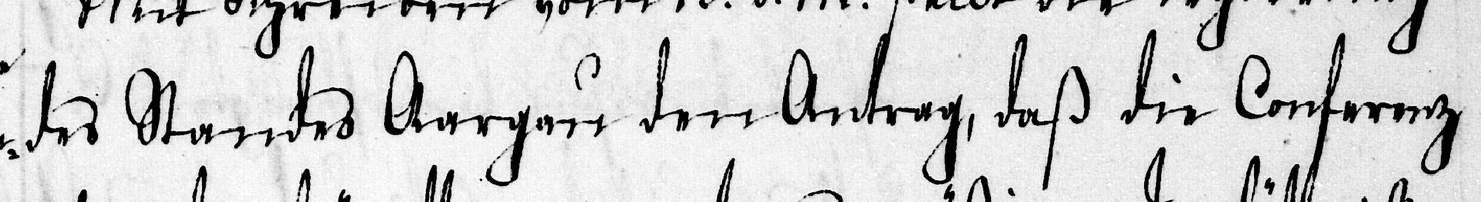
des Standes Aargau den Antrag, daß die Conferenz
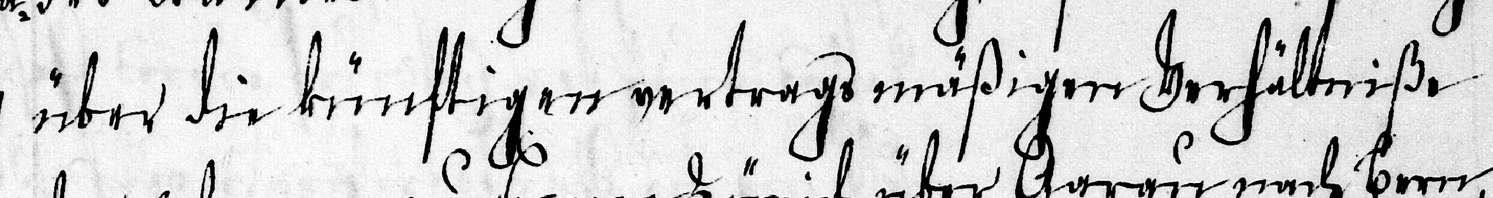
über die künftigen vertragsmäßigen Verhältniße
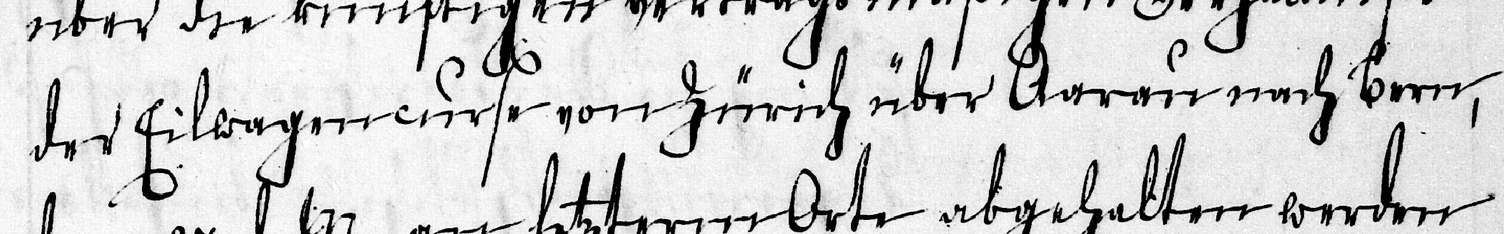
der Eilwagencurse von Zürich über Aarau nach Bern,
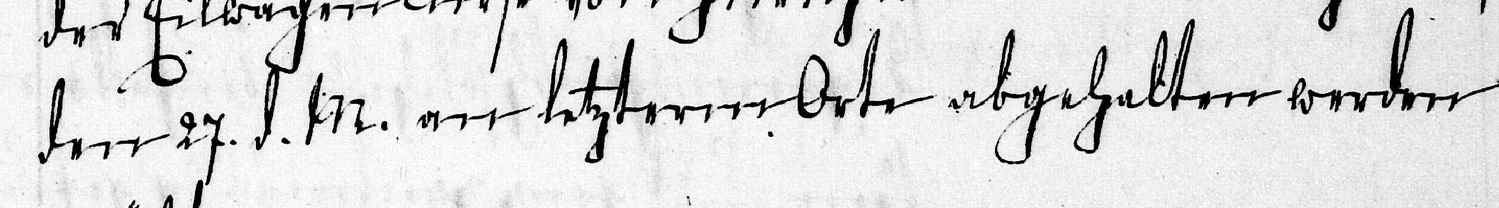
den 27. d. M. an letzterm Orte abgehalten werden
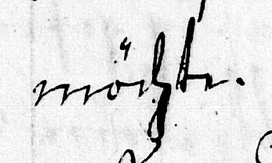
möchte.
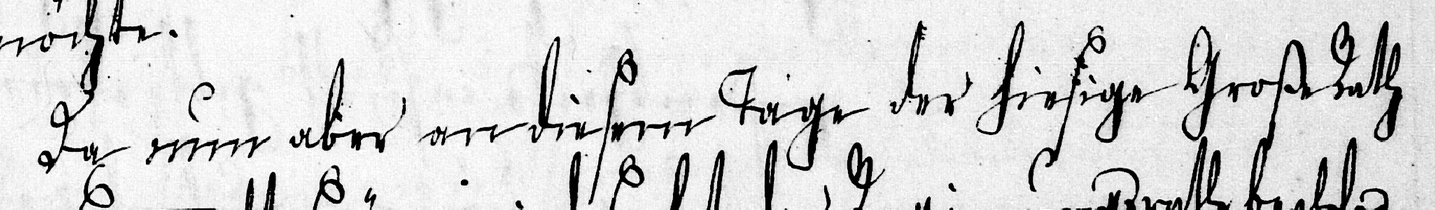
Da nun aber an diesem Tage der hiesige Große Rath
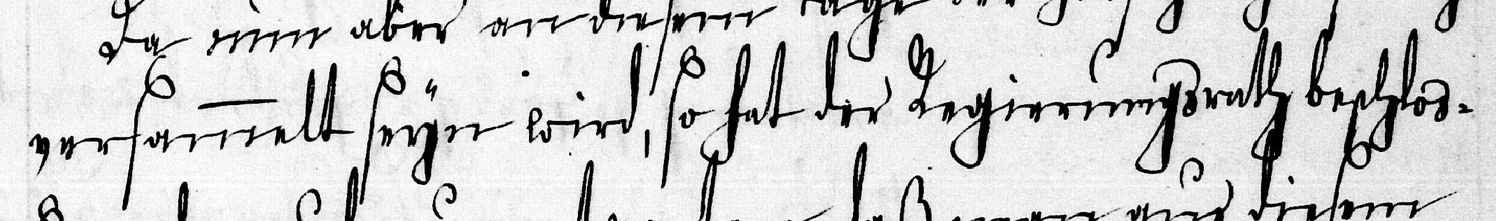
versammelt seyn wird, so hat der Regierungsrath beschl¬
